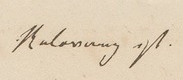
Relevanz ist.
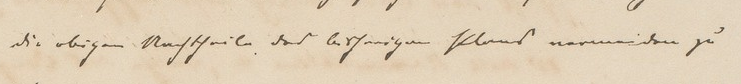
die obigen Nachtheile des bisherigen Plans vermeiden zu
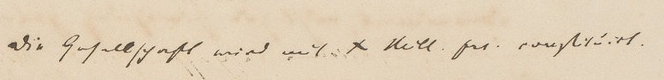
Die Gesellschaft wird mit X Mill. Frs constituirt.
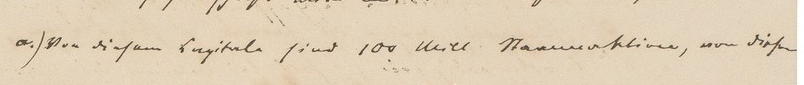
a.) Von diesem capitale sind 100 Mill. Stammaktien, von diesen
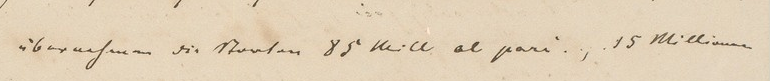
übernehmen die Staaten 85 Mill. al pari., 15 Millionen
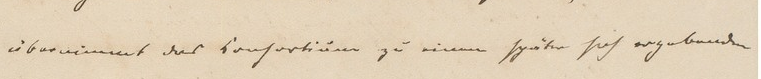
übernimmt das Consortium zu einem später sich ergebenden
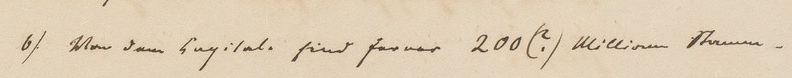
b.) Von dem Capitale sind ferner 200 (?) Millionen Stamm-
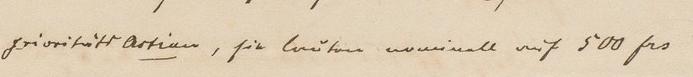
prioritätsActien, sie lauten nominell mit 500 Frs
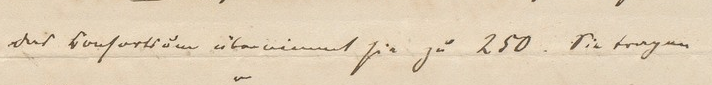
das Konsortium übernimmt sie zu 250. Sie tragen
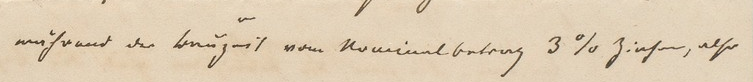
während der Bauzeit vom Nominalbetrag 3% Zinsen, also
